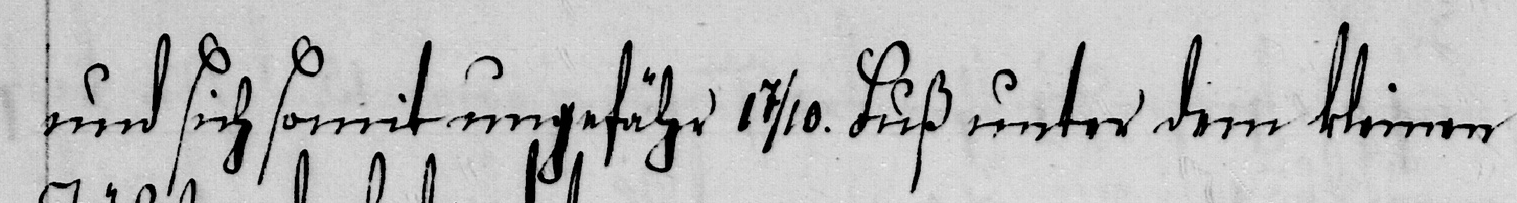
und sich somit ungefähr 17/10. Fuß unter dem kleinen
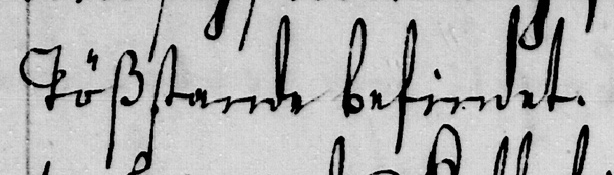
Tößstande befindet.
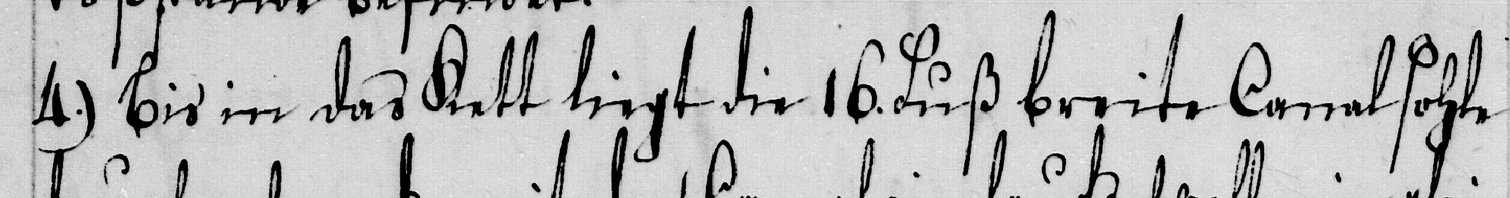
4.) Bis in das Kett liegt die 16. Fuß breite Canalsohle
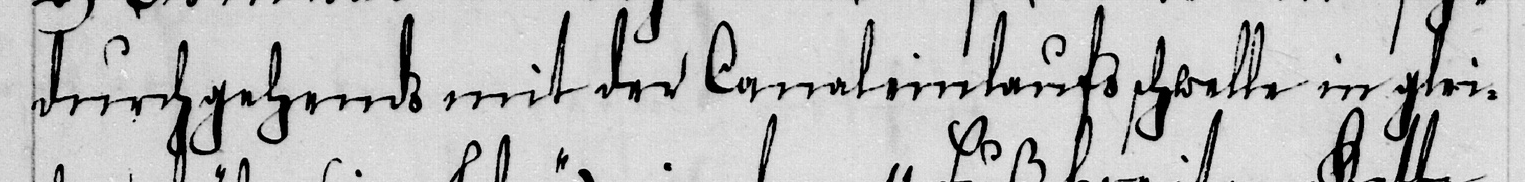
durchgehends mit der Canaleinlaufsschwelle in glei¬
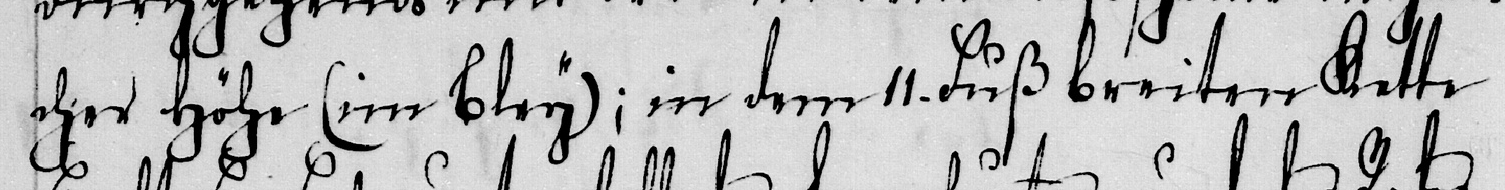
cher Höhe (im Bley); in dem 11. Fuß breiten Kette
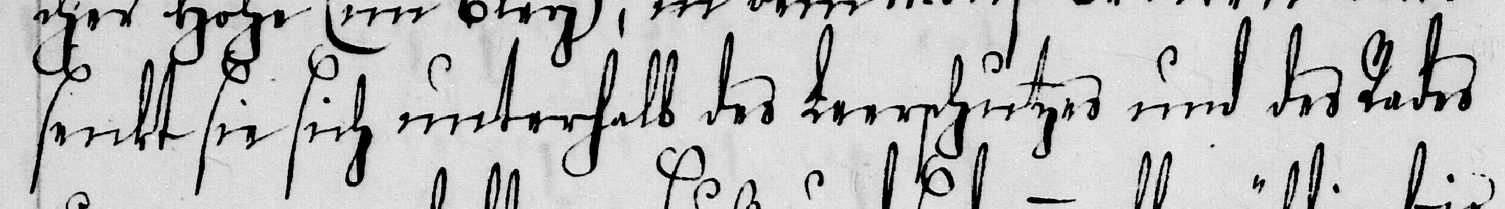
senkt sie sich unterhalb des Leerschutzes und des Rades
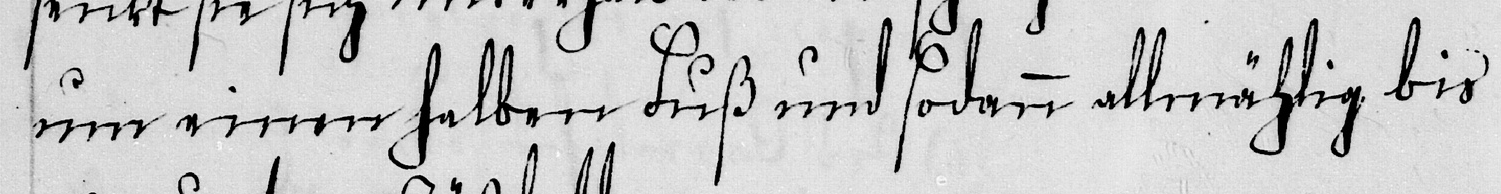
um einen halben Fuß und sodann allmächtig bis
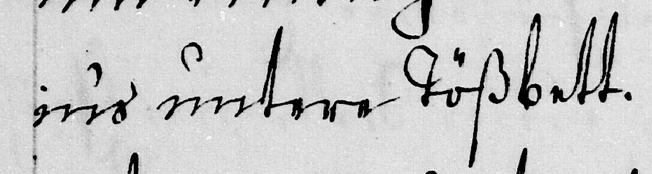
ins untere Tößbett.
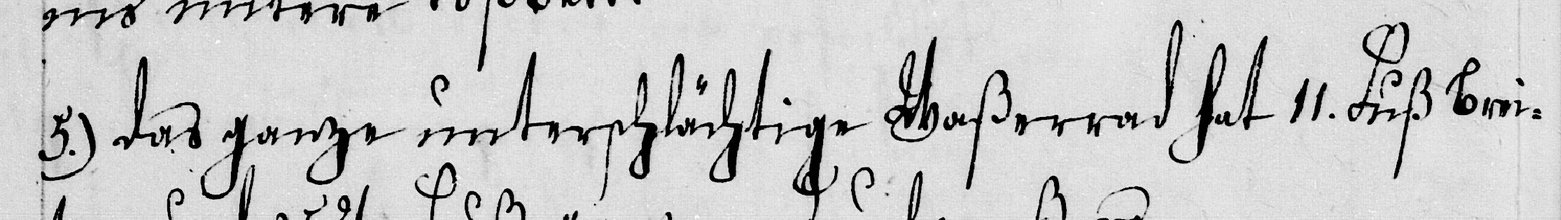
5.) das ganze unterschlächtige Waßerrad hat 11. Fuß Brei¬
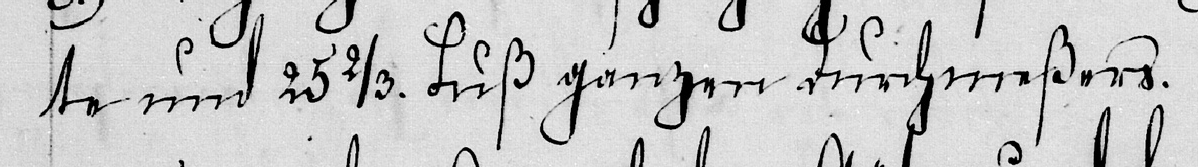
te und 25 2/3. Fuß ganzen Durchmeßers.
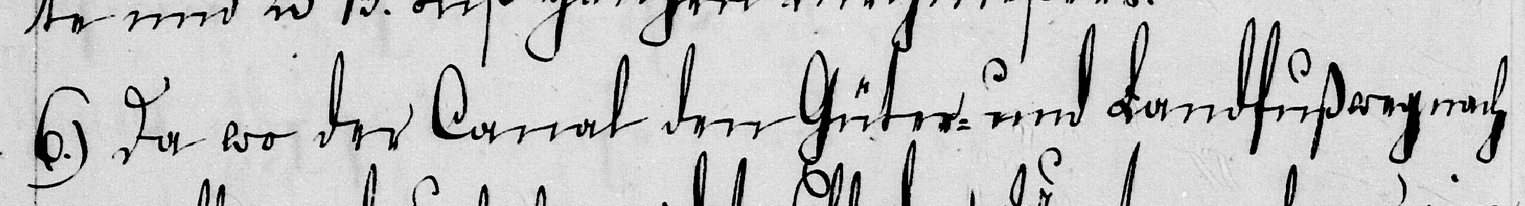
6.) Da wo der Canal den Güter- und Landfußweg nach
